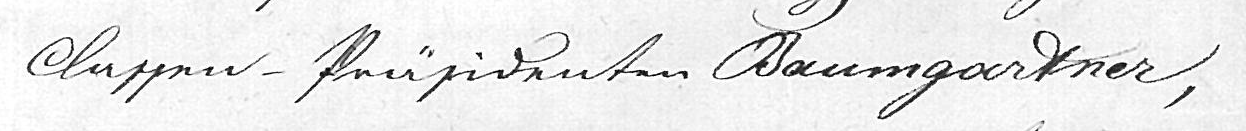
Classen-Präsidenten Baumgartner,
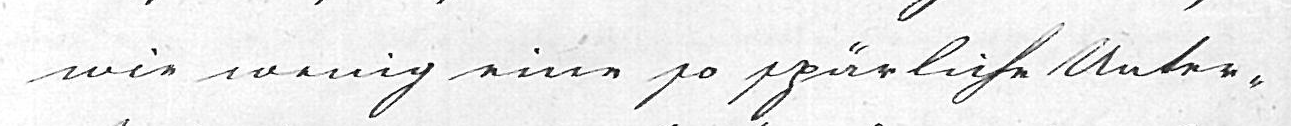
wie wenig eine so spärliche Unter-
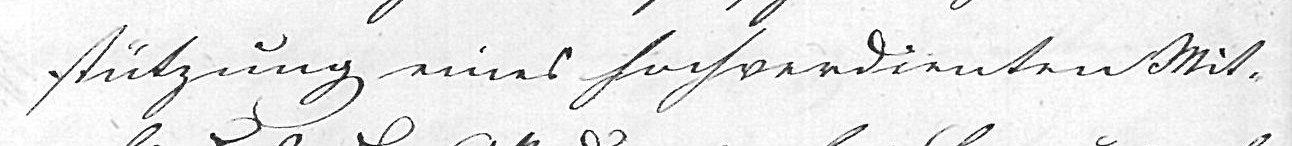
stützung eines hochverdienten Mit-
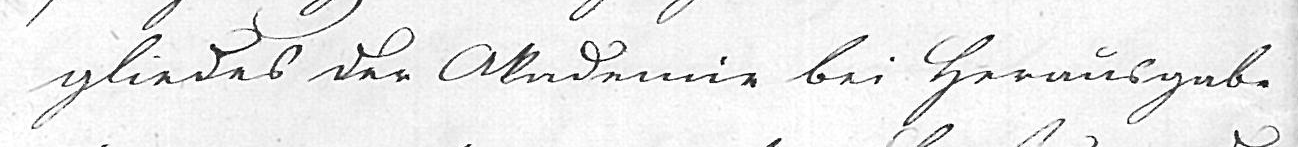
gliedes der Akademie bei Herausgabe
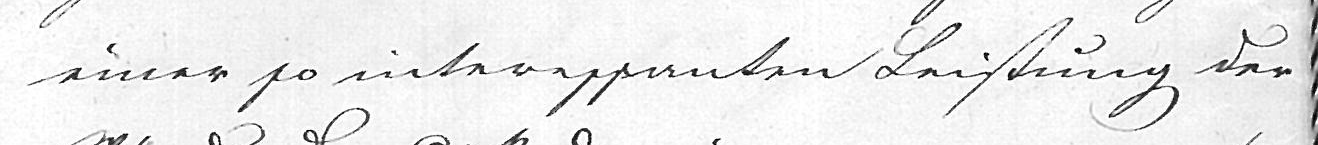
einer so interessanten Leistung der
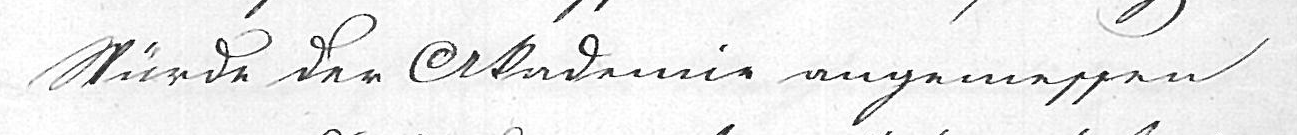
Würde der Akademie angemessen
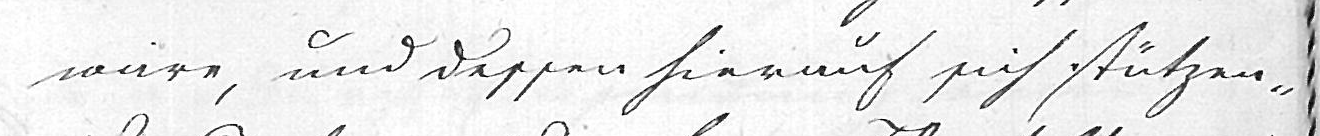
wäre, und dessen hierauf sich stützen-
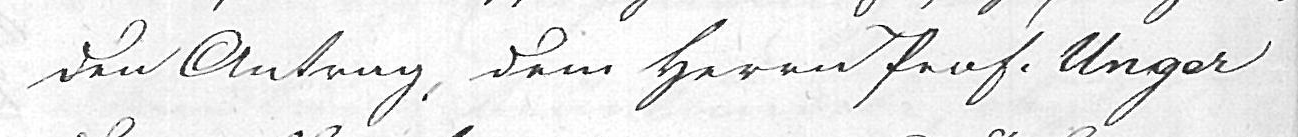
den Antrag, dem Herrn Prof. Unger
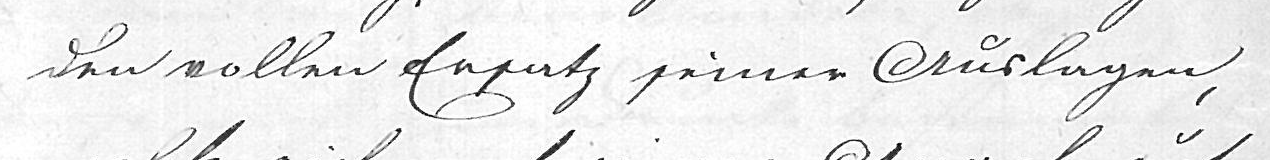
den vollem Ersatz seiner Auslagen,
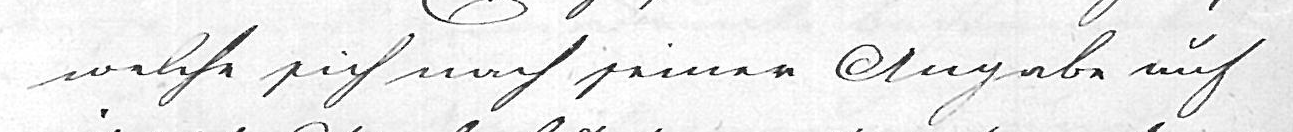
welche sich nach seiner Angabe auf
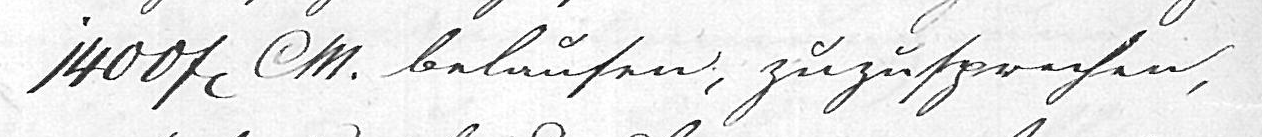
1400 fl. CM belaufen, zuzusprechen,
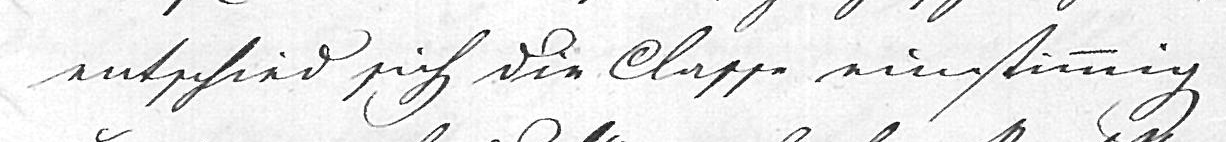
entschied sich die Classe einstimmig
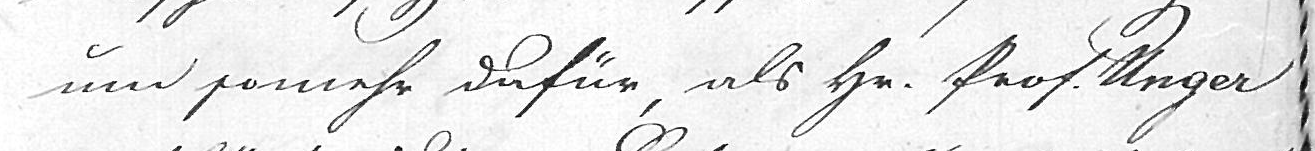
um somehr dafür, als Hr. Prof. Unger
